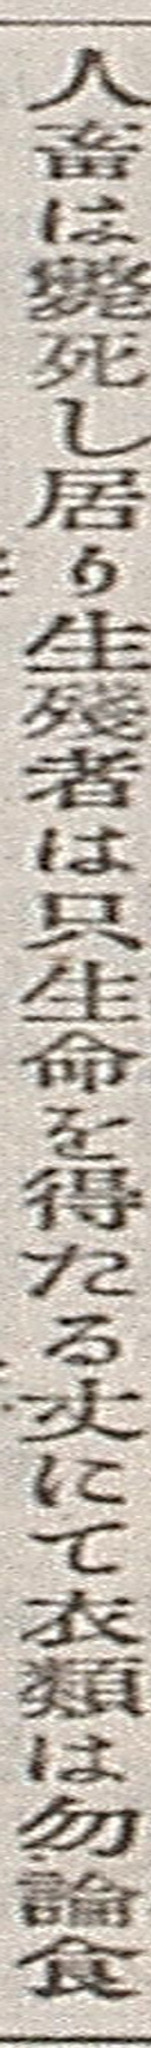人畜は斃死し居り生残者は只生命を得たる丈にて衣類は勿論食
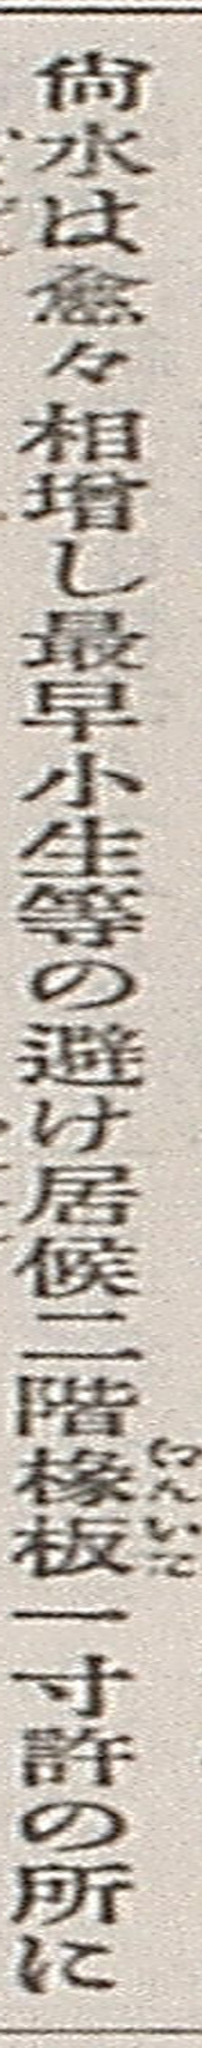尚水は愈々相憎し最早小生等の避け居候二階椽板一寸許の所に
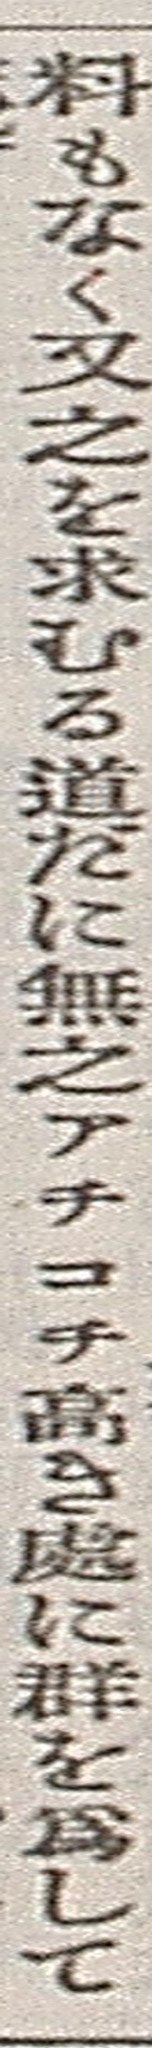料もなく又之を求むる道だに無之アチコチ高き処に群を為して
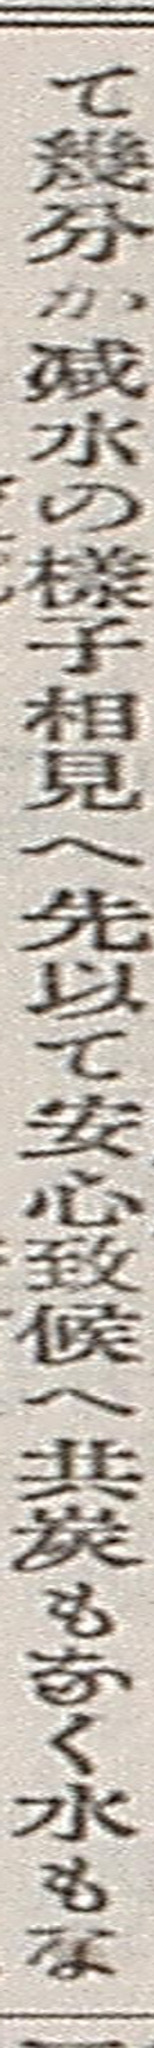て幾分か減水の様子相見へ先以て安心致候へ共炭もなく水もな
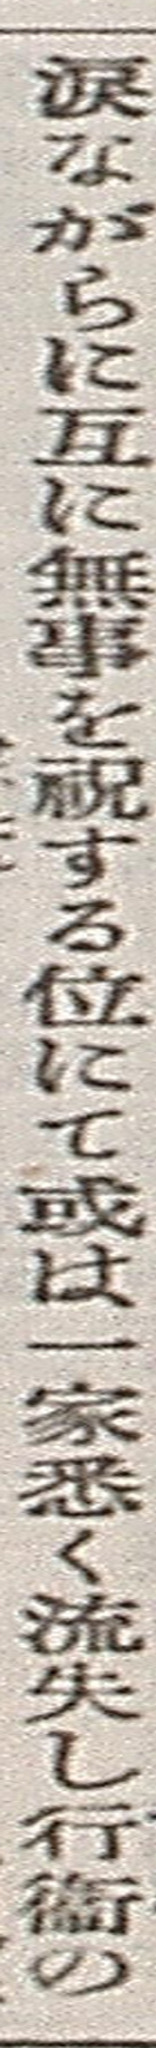涙ながらに互に無事を祝する位にて或は一家悉く流失し行衛の
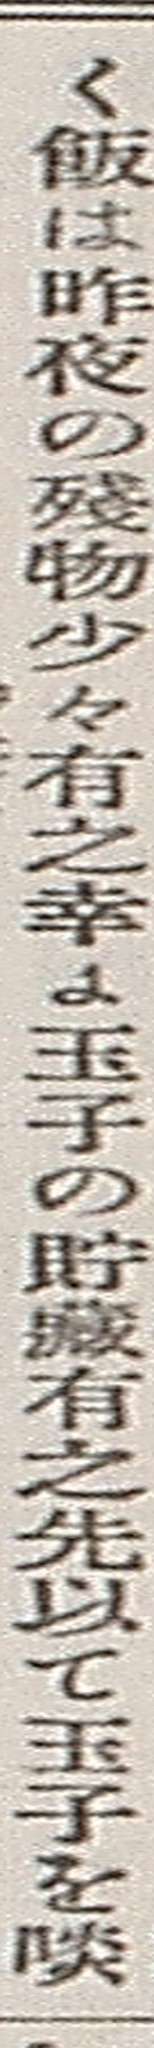く飯は昨夜の残物少々有之幸に玉子の貯蔵有之先以て玉子を啖
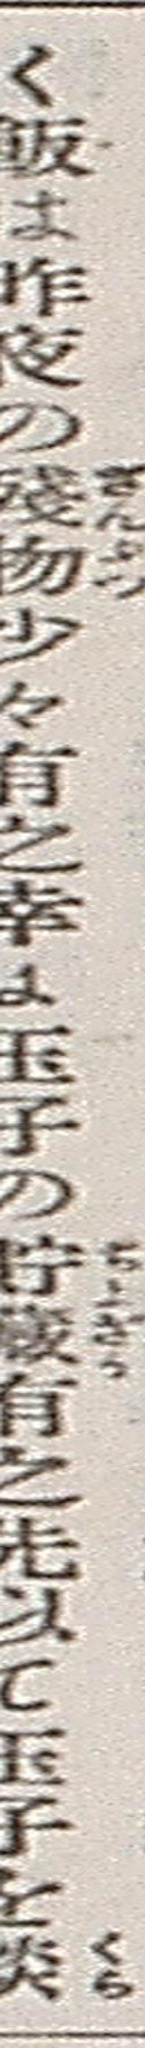く飯は昨夜の残物少々有之幸に玉子の貯蔵有之先以て玉子を啖
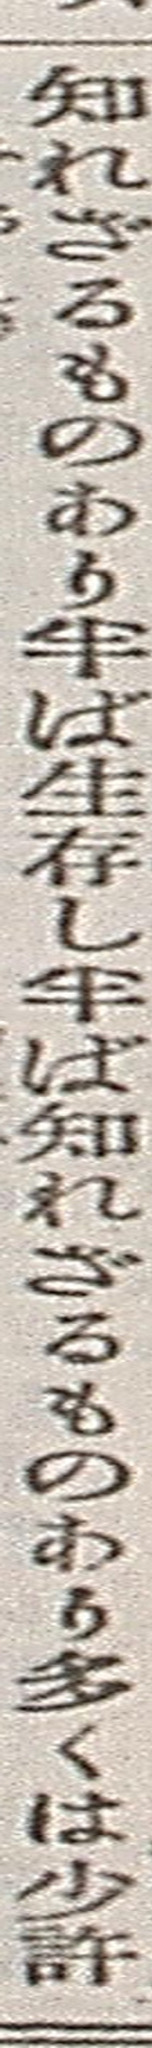知れざるものあり半ば生存し半ば知れざるものあり多くは少許
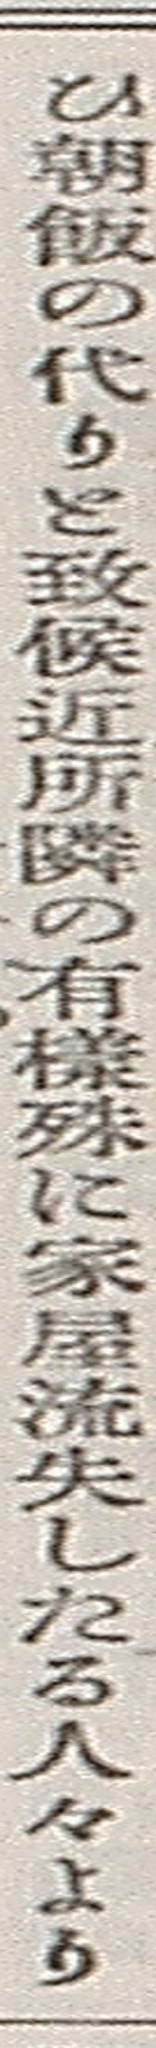ひ朝飯の代りと致候近所鄰の有様殊に家屋流失したる人々より
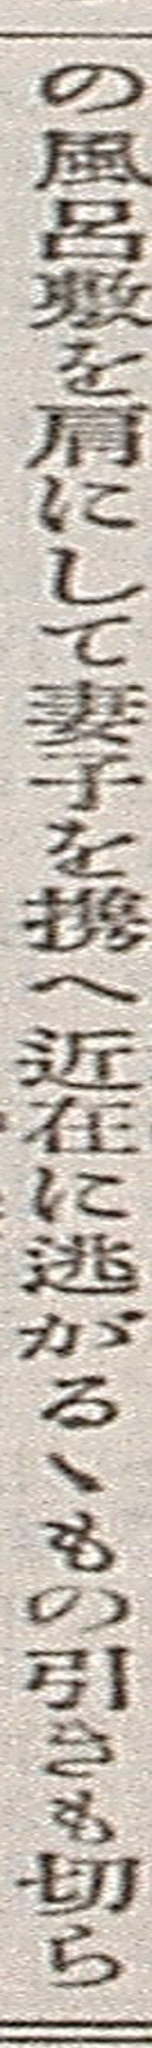の風呂敷を肩にして妻子を携へ近在に逃がるゝもの引きも切ら
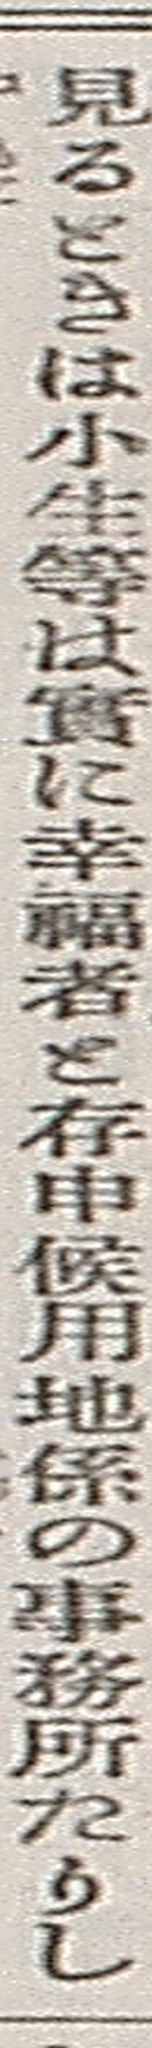見るときは小生等は実に幸福者と存申候用地係の事務所たりし
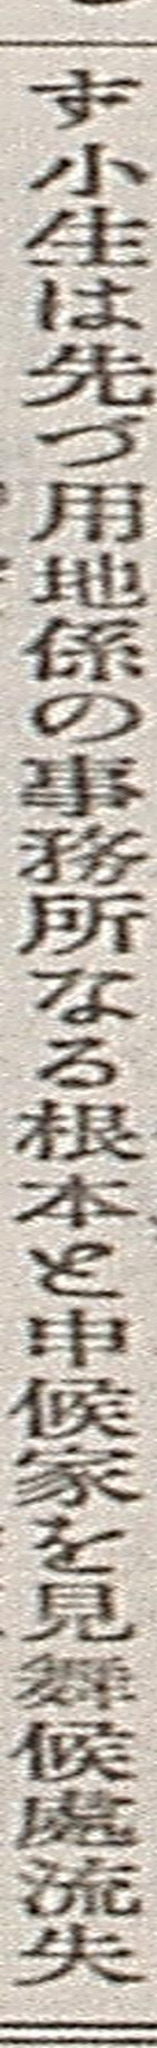ず小生は先づ用地係の事務所なる根本と申候家を見舞候処流失
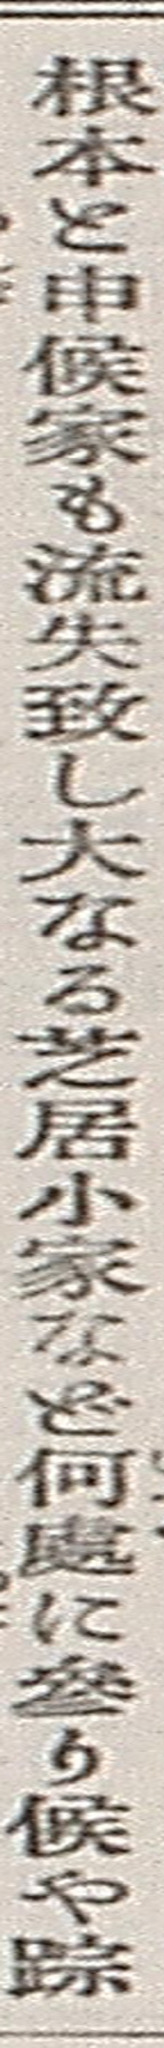根本と申候家も流失致し大なる芝居小屋など何処に参り候や踪
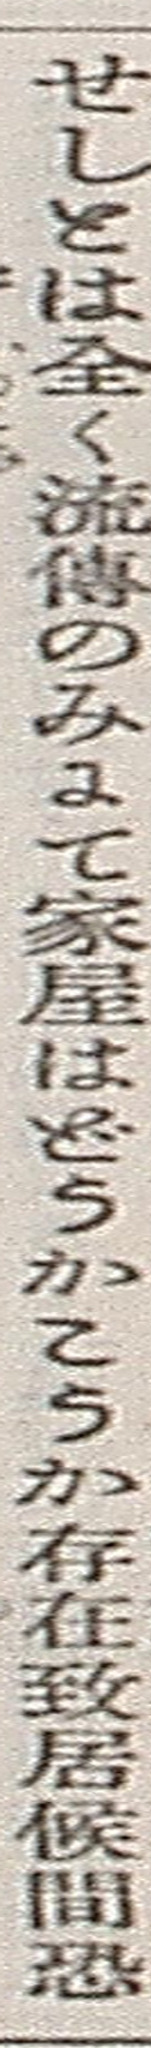せしとは全く流伝のみにて家屋はどうかこうか存在致居候間恐
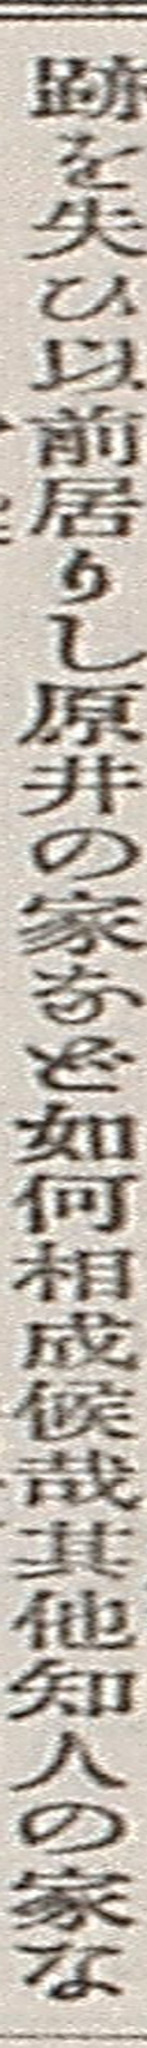跡を失ひ以前居りし原井の家など如何相成候哉其他知人の家な
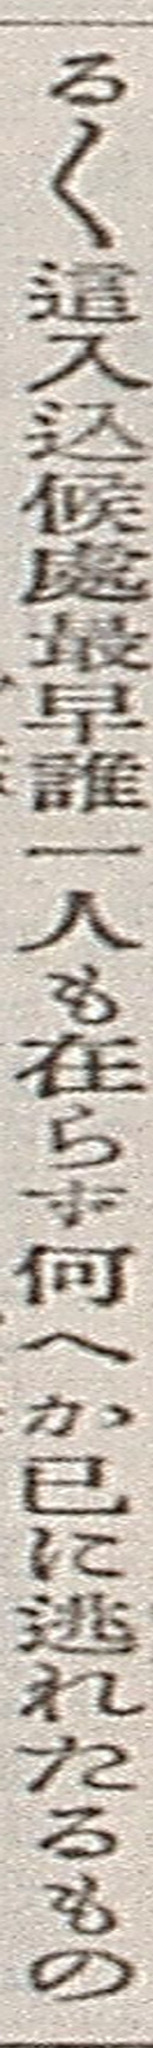る〳〵這入込候処最早誰一人も在らず何へか已に逃れたるもの
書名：風俗畫報臨時増刊第百二十六號　洪水被害録（中）
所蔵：東京大学地震研究所図書室 Earthquake Research Institute Library, The University of Tokyo, JAPAN
